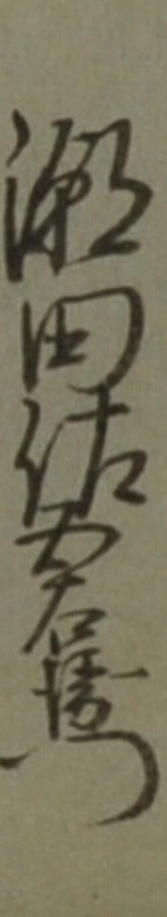瀬田佐五右衛門
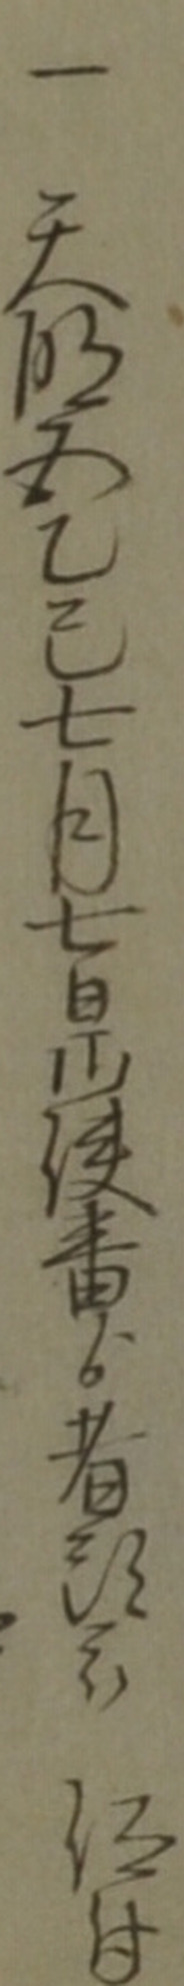一天明五乙巳七月七日御使番ゟ者頭被仰付
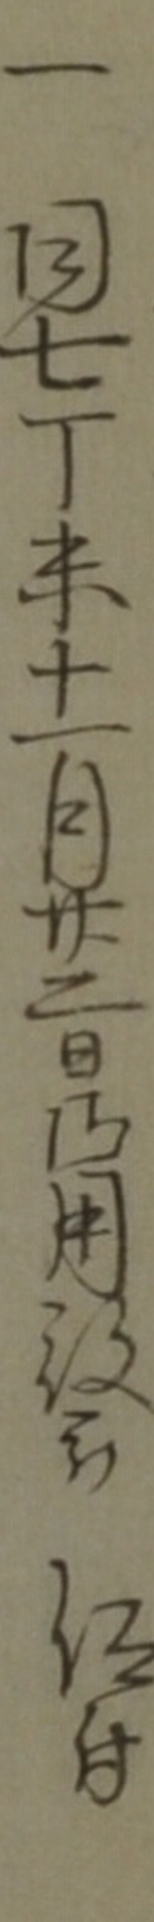一同七丁未十一月廿二日御用役被仰付
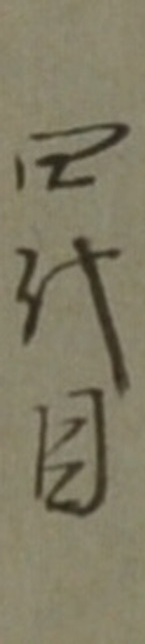四代目
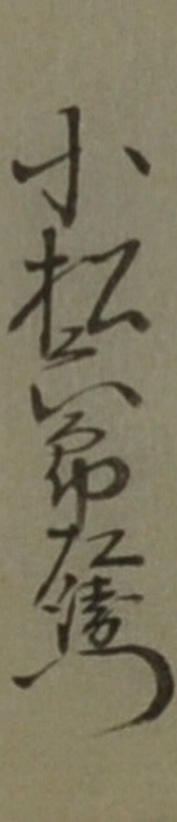小松六郎左衛門
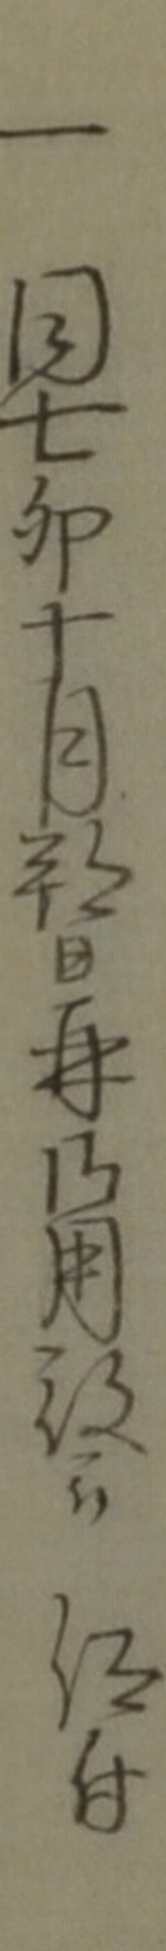一同七卯十月朔日再御用役被仰付
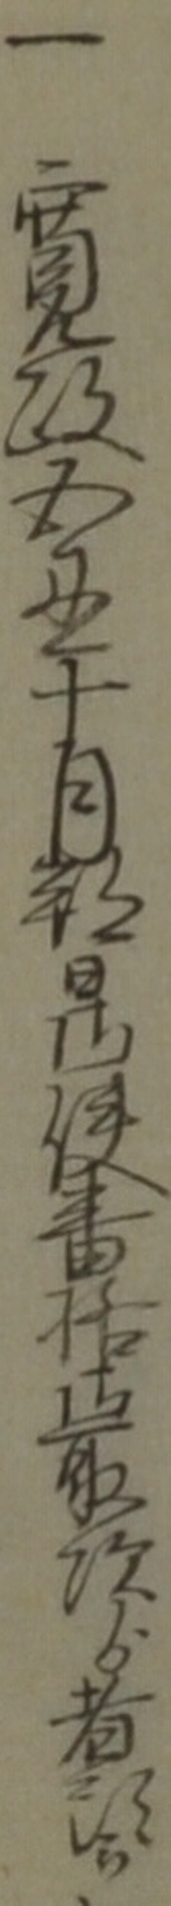一寛政五丑十月朔日御使番格御取次ゟ者頭被仰付
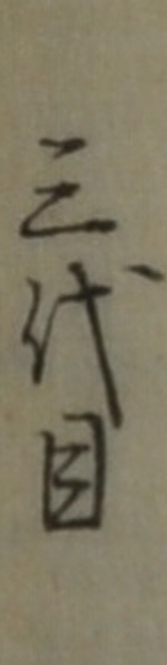三代目
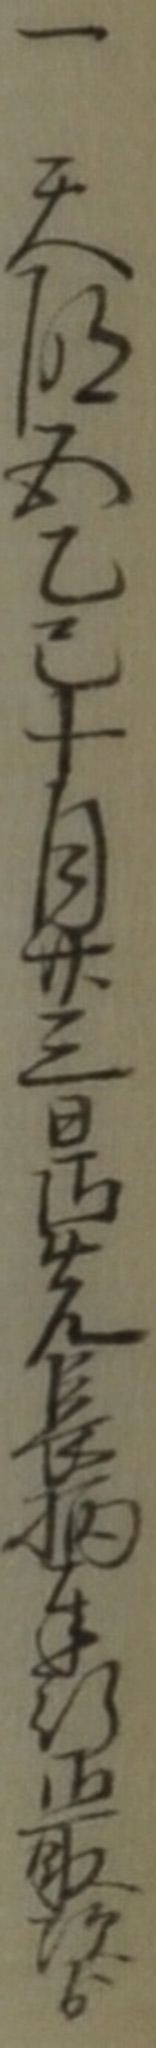一天明五乙巳十月廿三日御先長柄奉行御取次ゟ
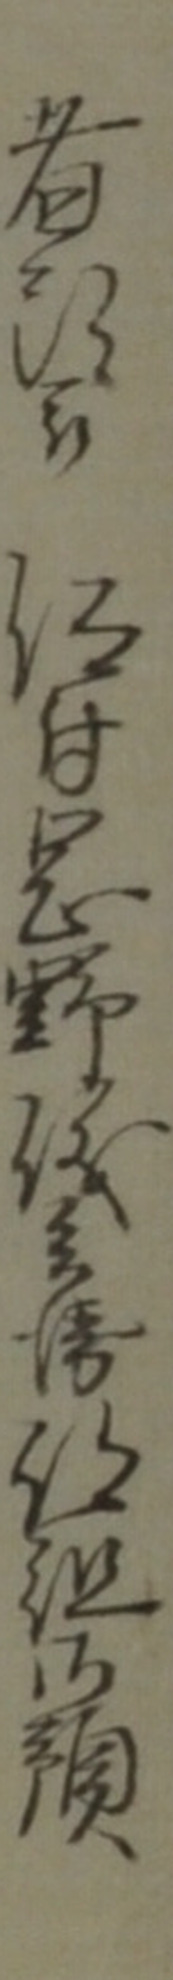者頭被仰付岡野儀兵衛跡組御預
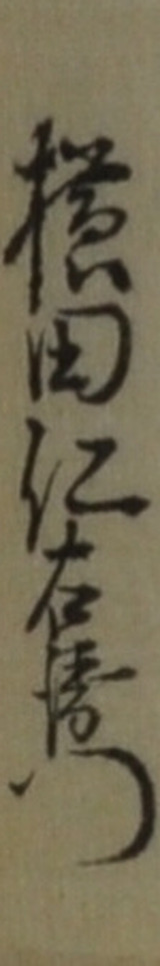横田仁右衛門
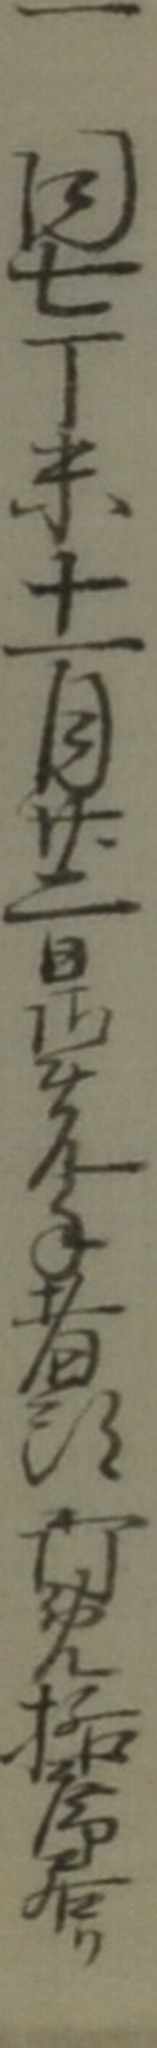一同七丁未十一月廿二日御先手者頭御免格席居り
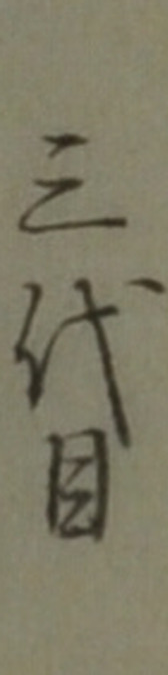三代目
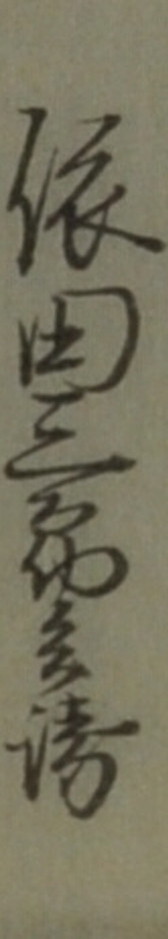依田三郎兵衛
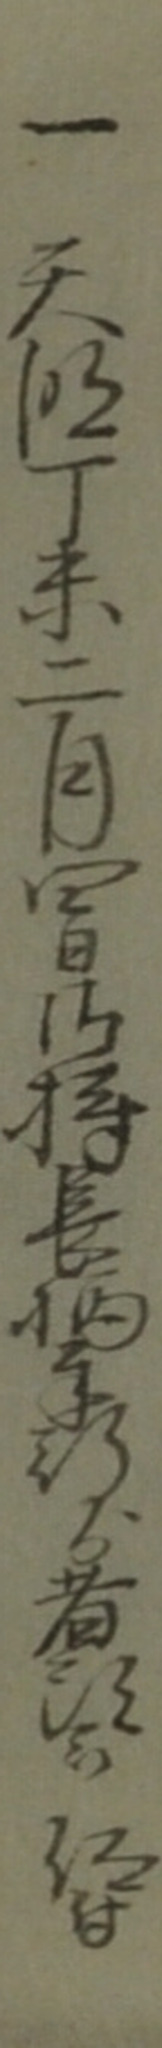一天明丁未二月四日御持長柄奉行ゟ者頭被仰付
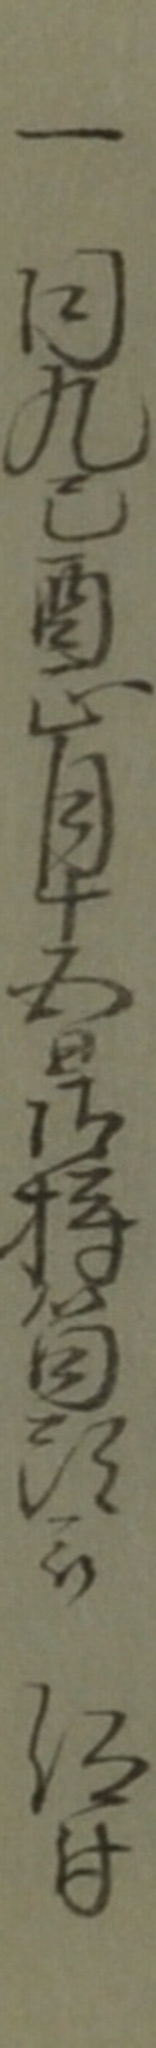一同九己酉正月十五日御持筒頭被仰付
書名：諸御役代々録（二）
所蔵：伊那市立高遠町図書館・合同会社AMANE
